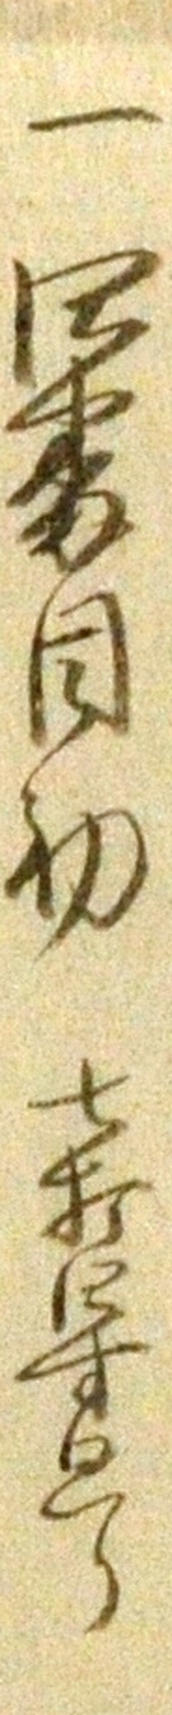一四番目切七打四寸廻り
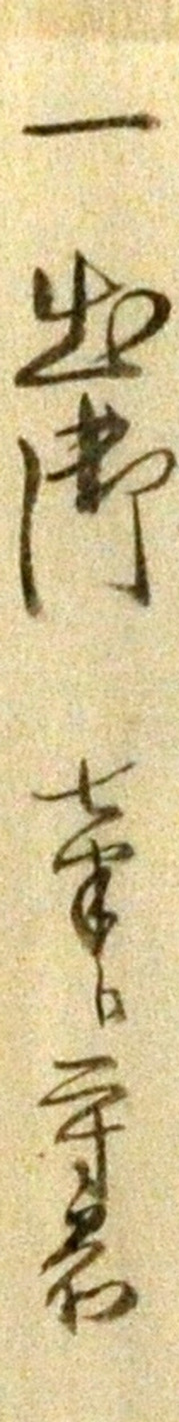一出御七半え二寸前
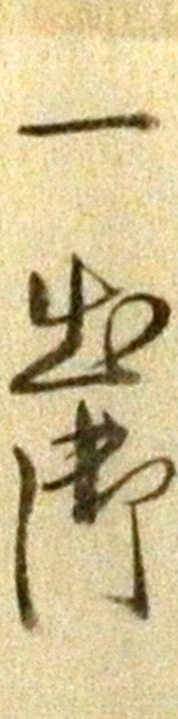一入御
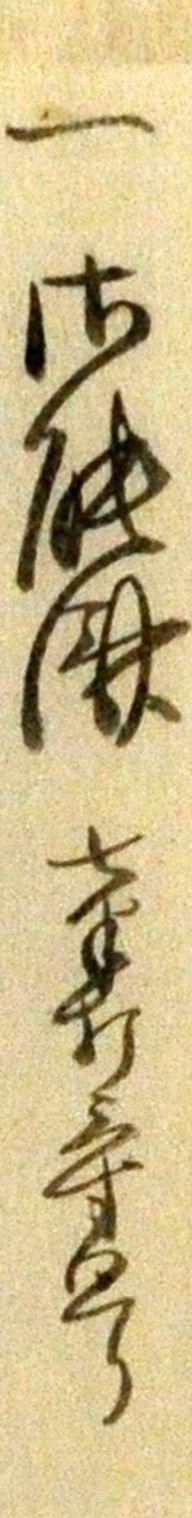一御能済七半打三分廻り
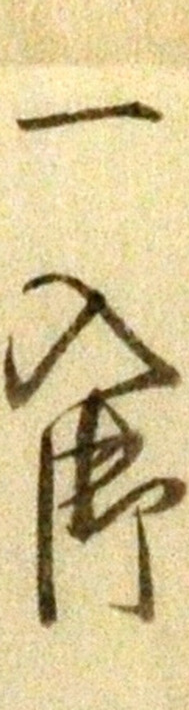一入御
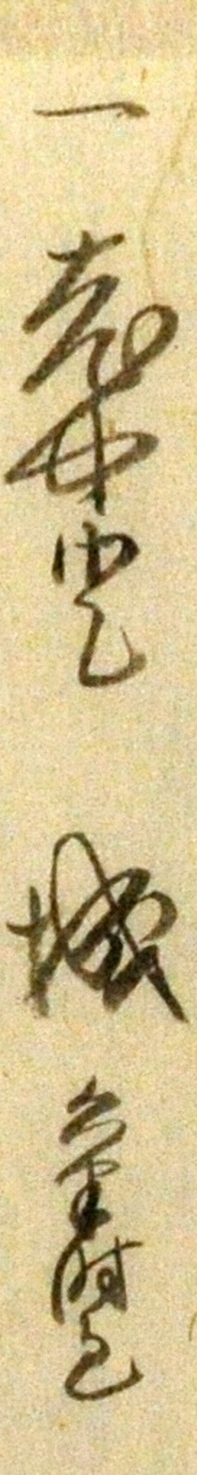一老中登城六半時過
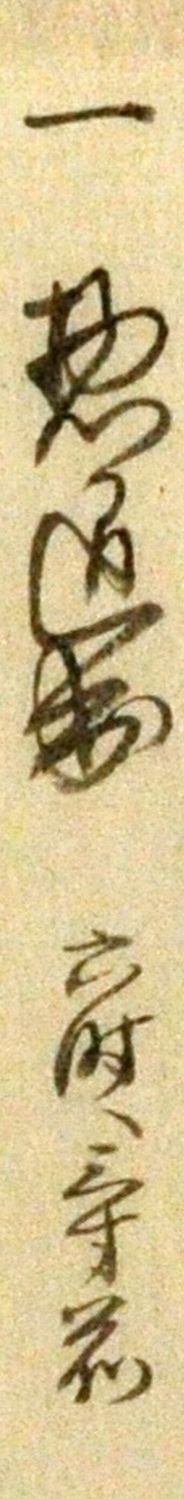一惣退出六時ヘ三寸前
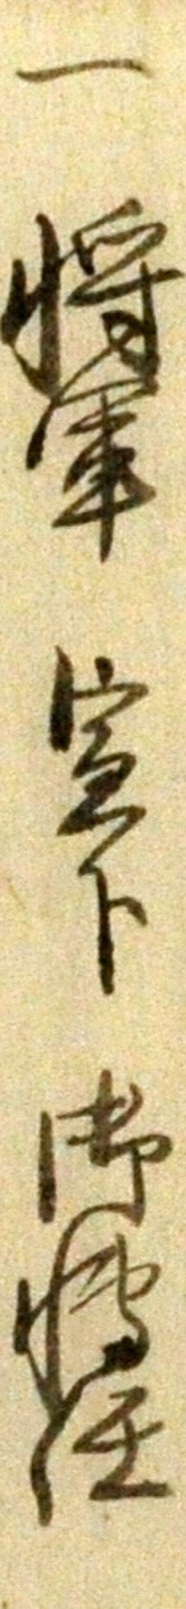一将軍宣下御転任
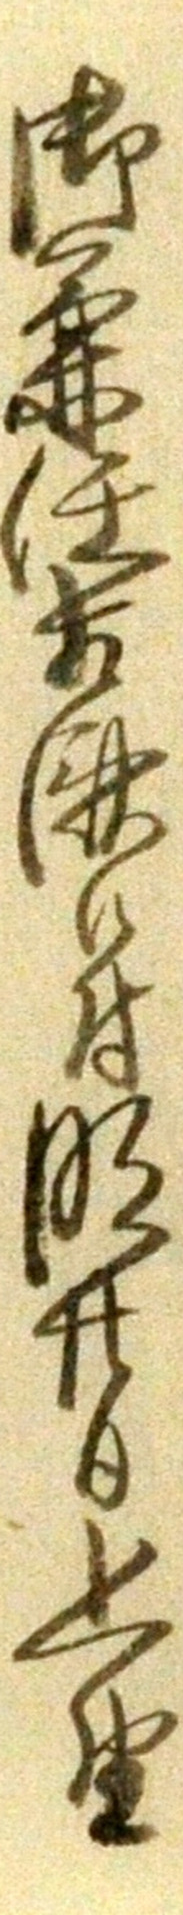御兼任相済候付明廿日上坐
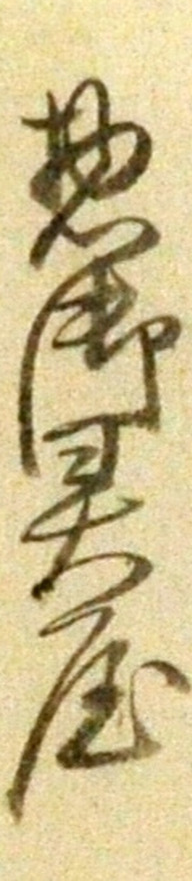惣御霊屋

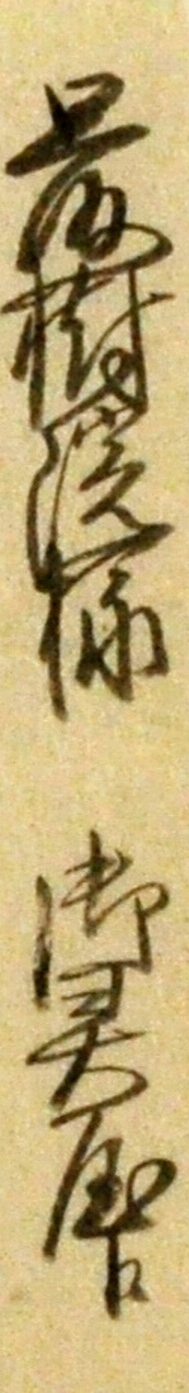最樹院様御霊屋え
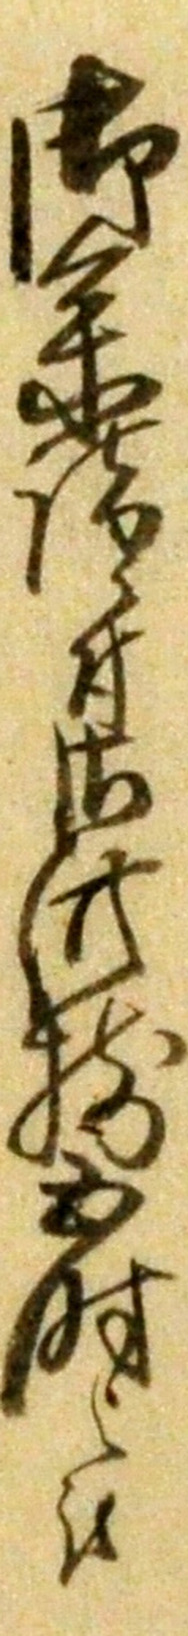御参詣ニ付御供揃五時被
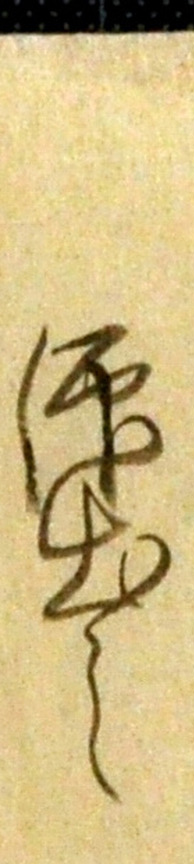仰出之
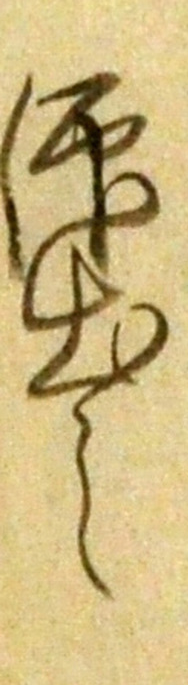仰出之

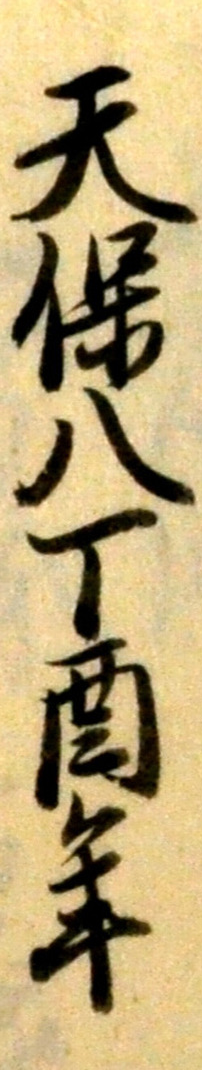天保八丁酉年
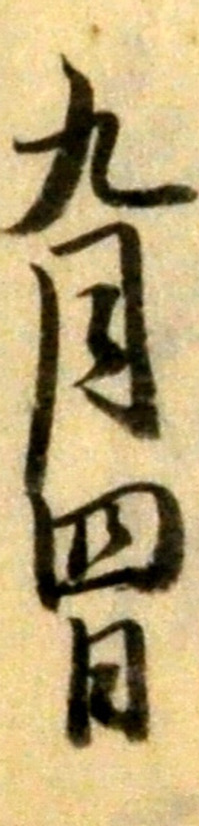九月四日
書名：御馳走御能ノ節ノ留外
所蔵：伊那市立高遠町図書館・合同会社AMANE
